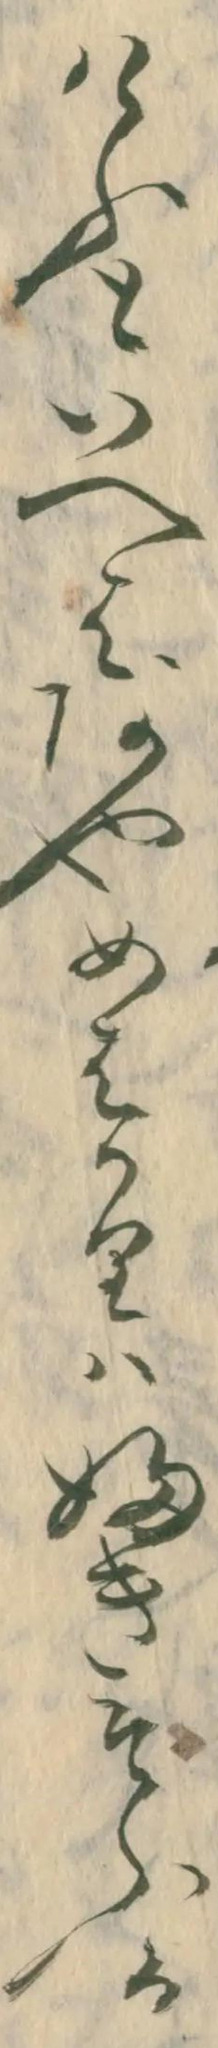けふといへはあやめはかりはふきそふる
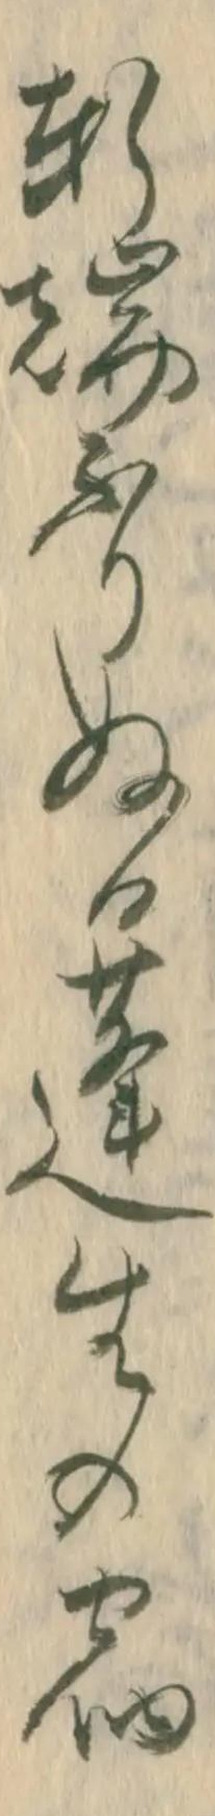軒端ふりぬる蓬生の宿

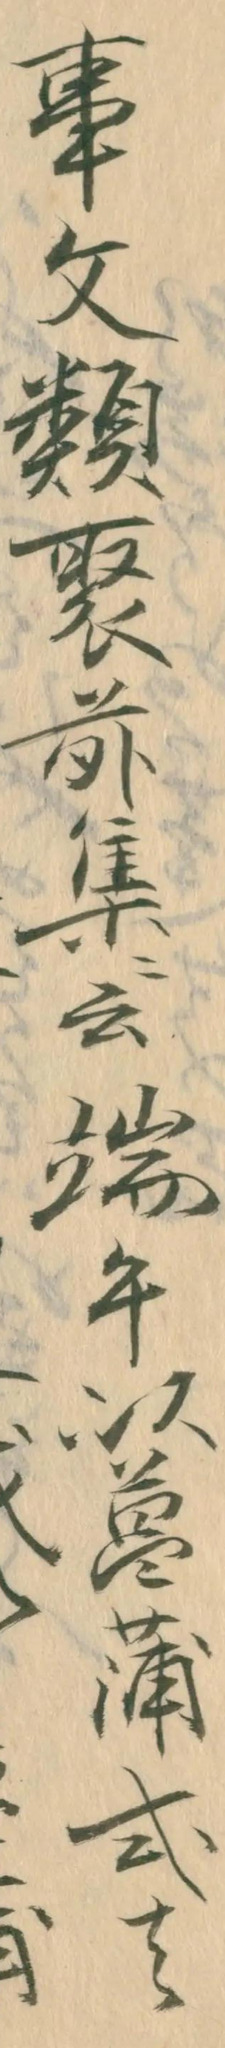事文類聚前集に云端午以菖蒲式は
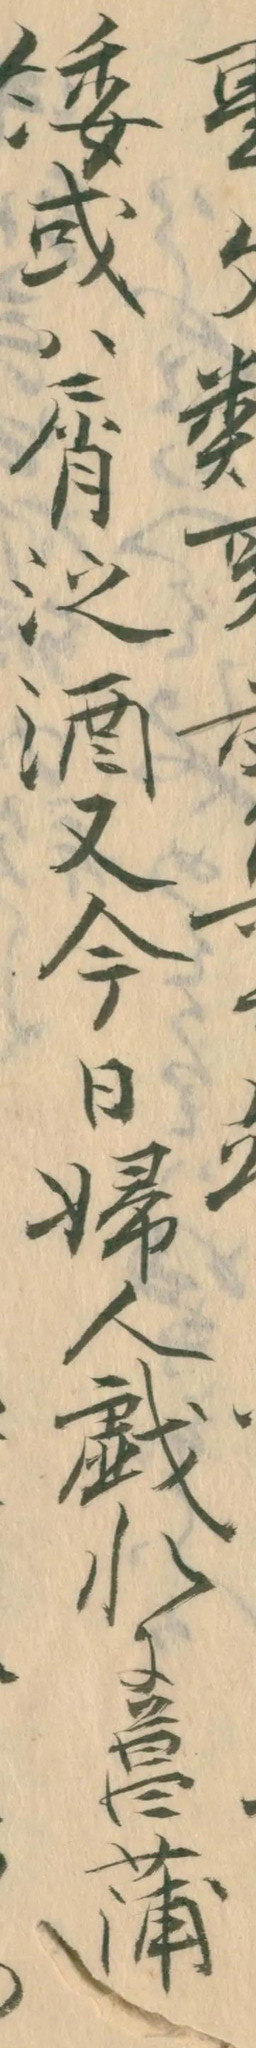緌或は屑泛酒又今日婦人戯れに菖蒲
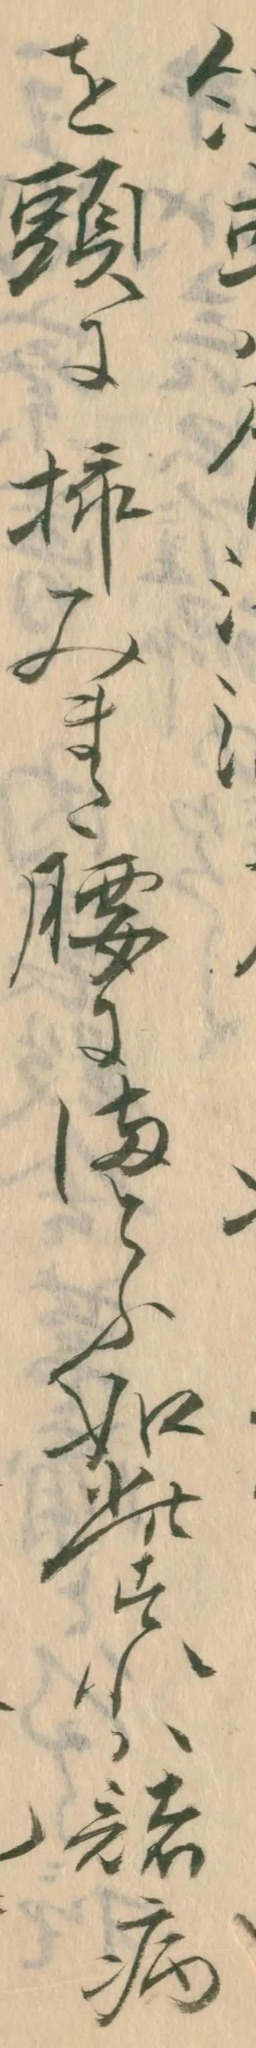を頭に挿みまた腰にまとふ如此すれは諸病
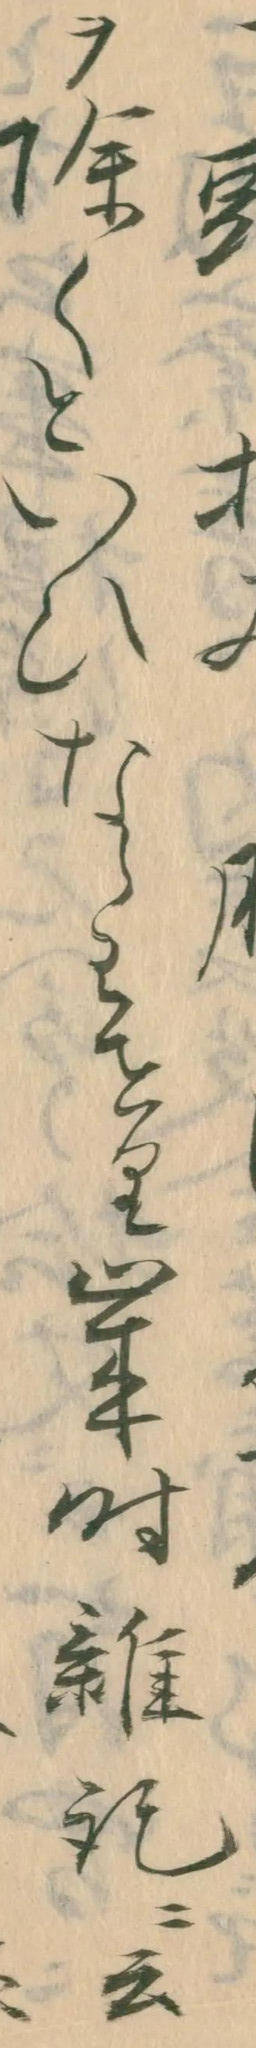を除くといひならわせり歳時雑記に云
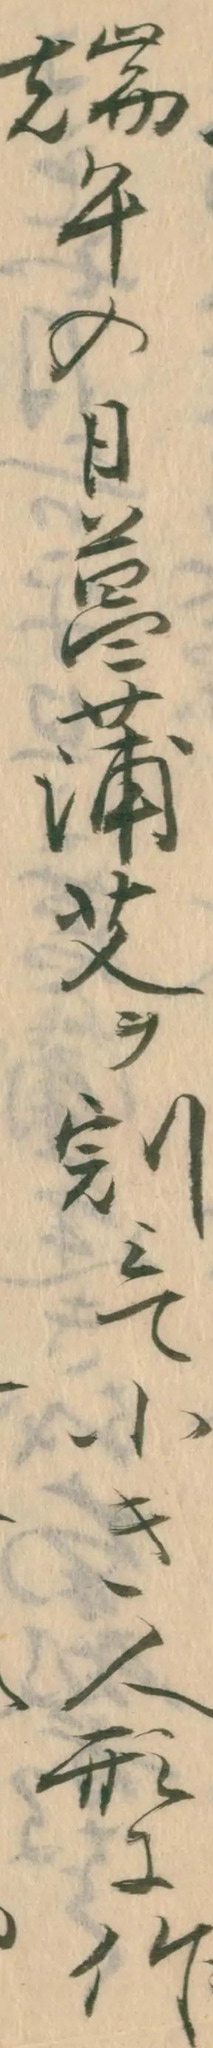端午の日菖蒲艾を割みて小き人形に作
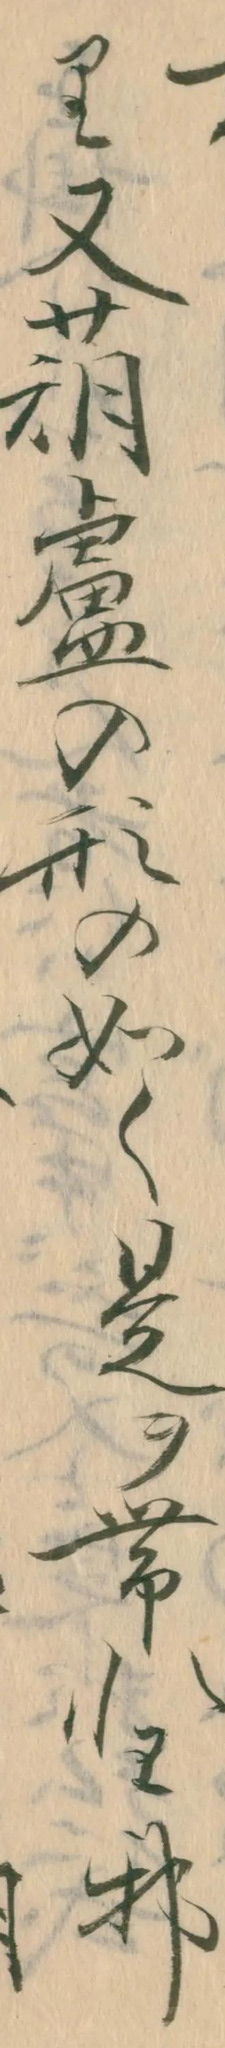り又葫盧の形の如く是を帯れわ邪
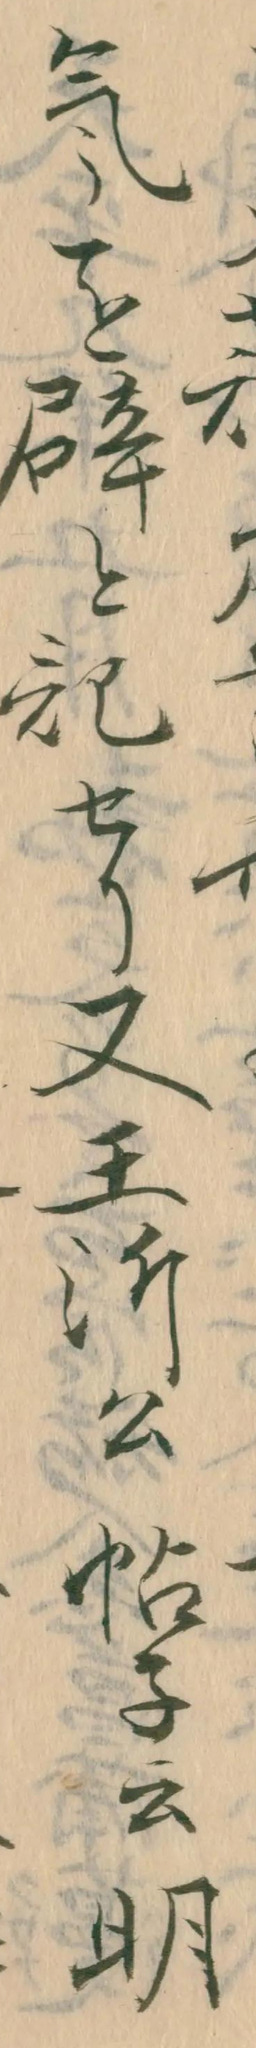気を辟と記せり又王沂公帖子云明
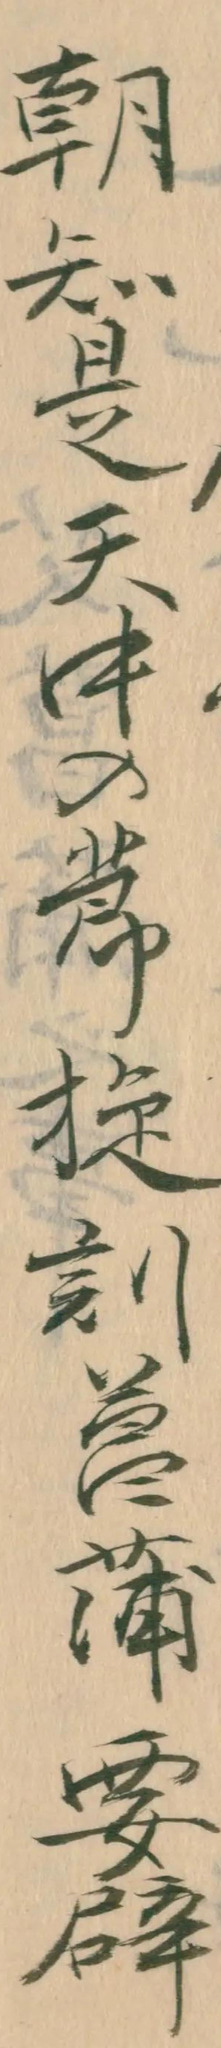朝知是天中の節旋刻菖蒲要辟
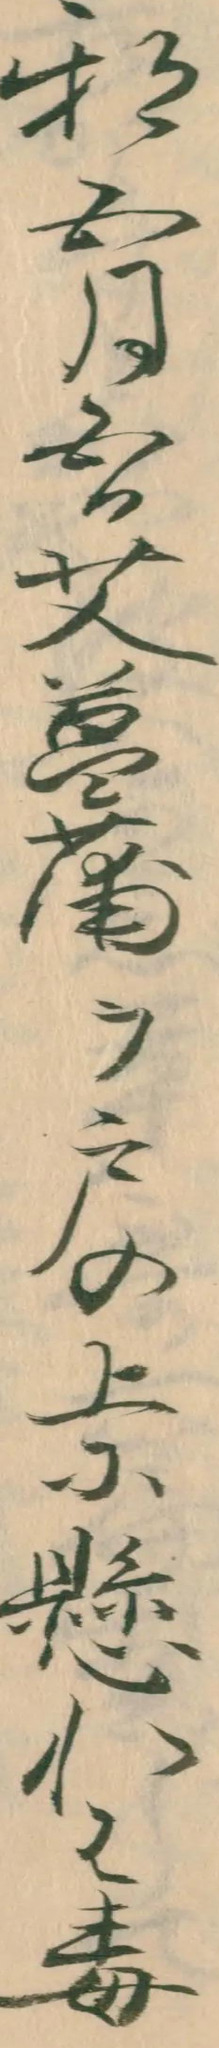邪五月五日艾菖蒲を戸の上に懸れは毒
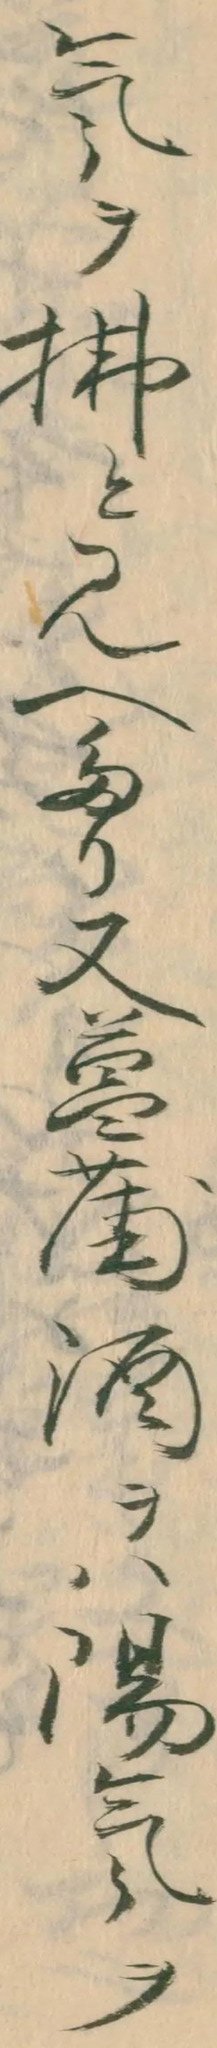気を払と見へたり又菖蒲酒をは陽気を
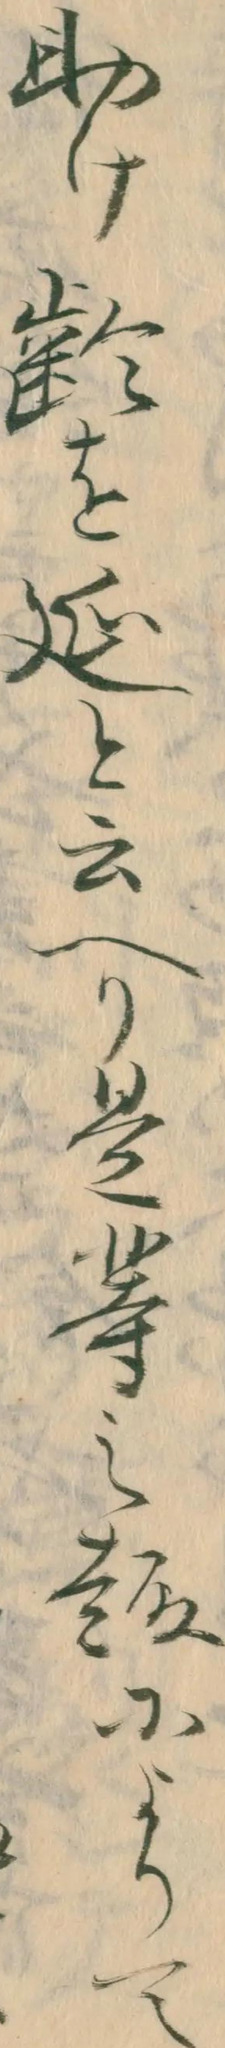助け齢を延と云へり是等之趣によりて
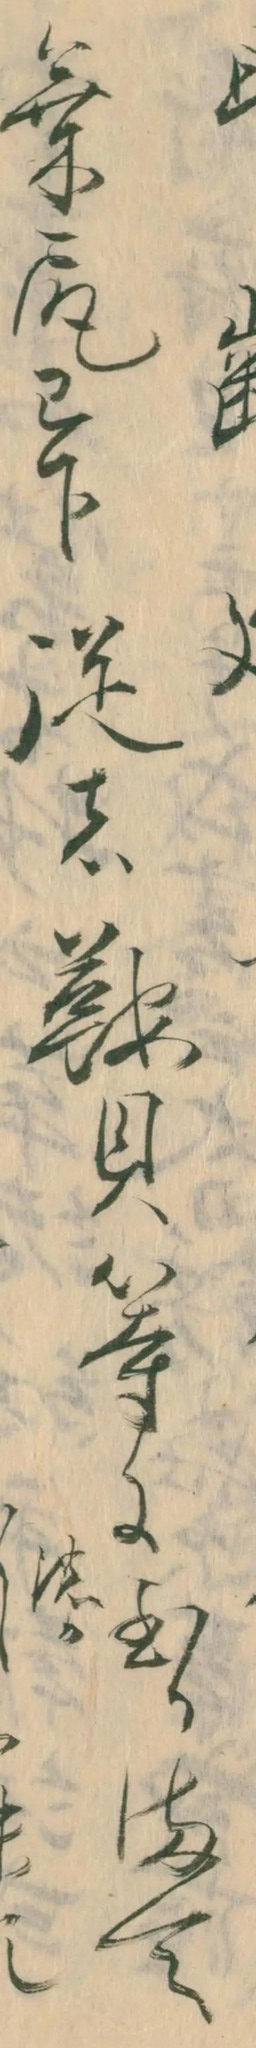乗尻已下従者鞍貝等に至るまて
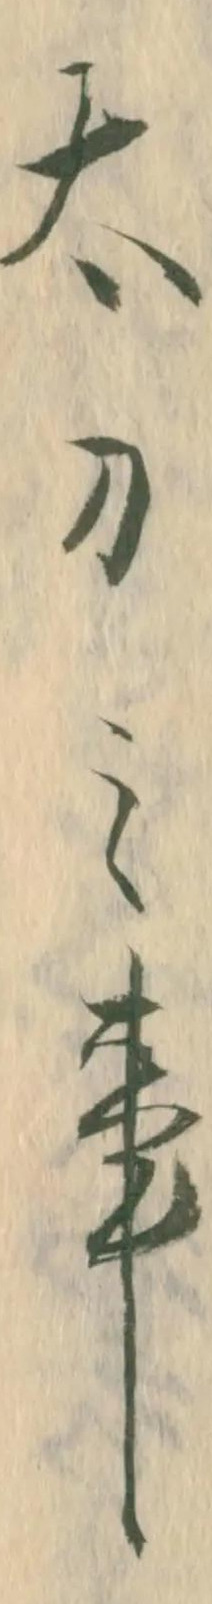太刀之事
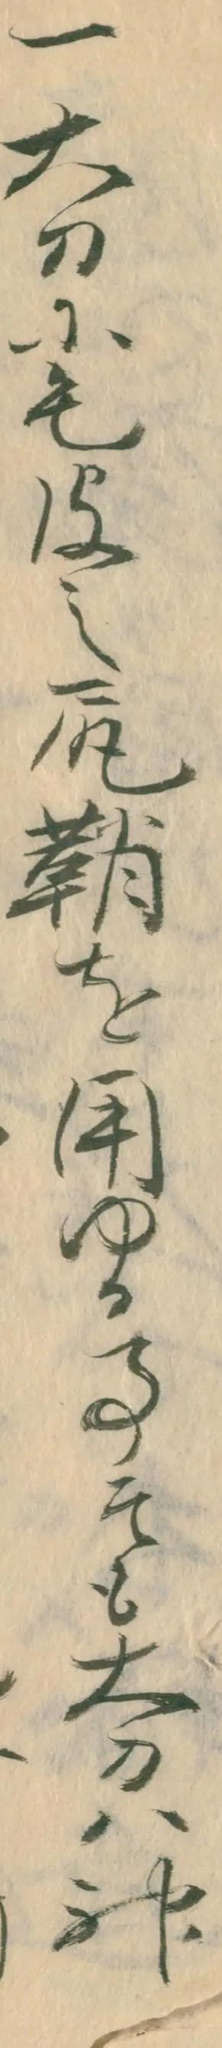一大刀にも皮之尻鞘を用ゆる事そも大刀は神
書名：賀茂社記録. 第12冊
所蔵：国立国会図書館 National Diet Library, JAPAN
